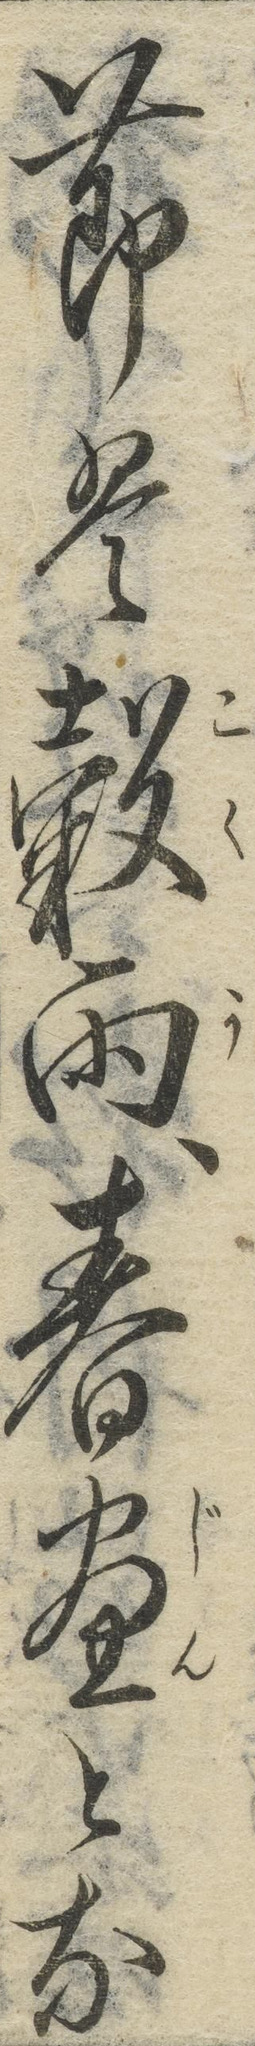節は穀雨、春尽とな

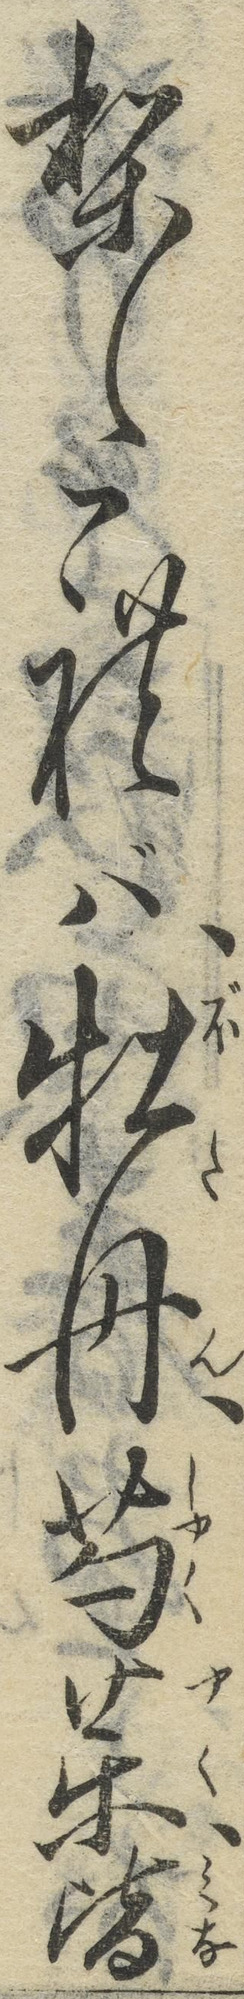りたれば、牡丹、芍薬、皆
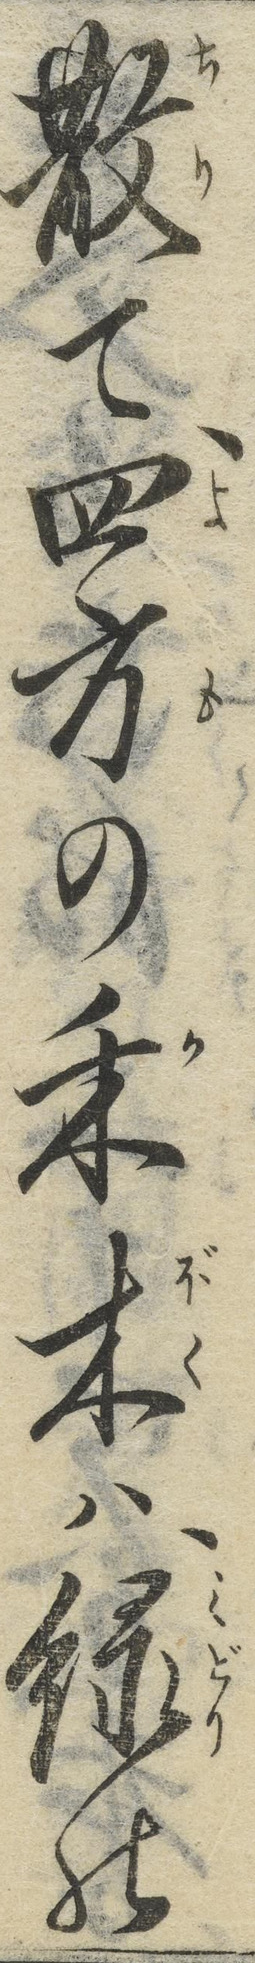散て、四方の禾木は、緑の
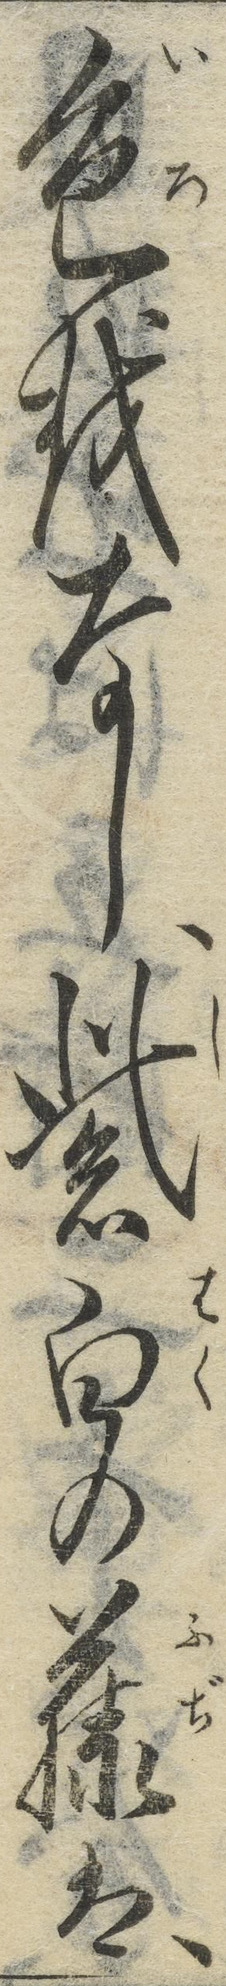色をなし、紫白の藤は、
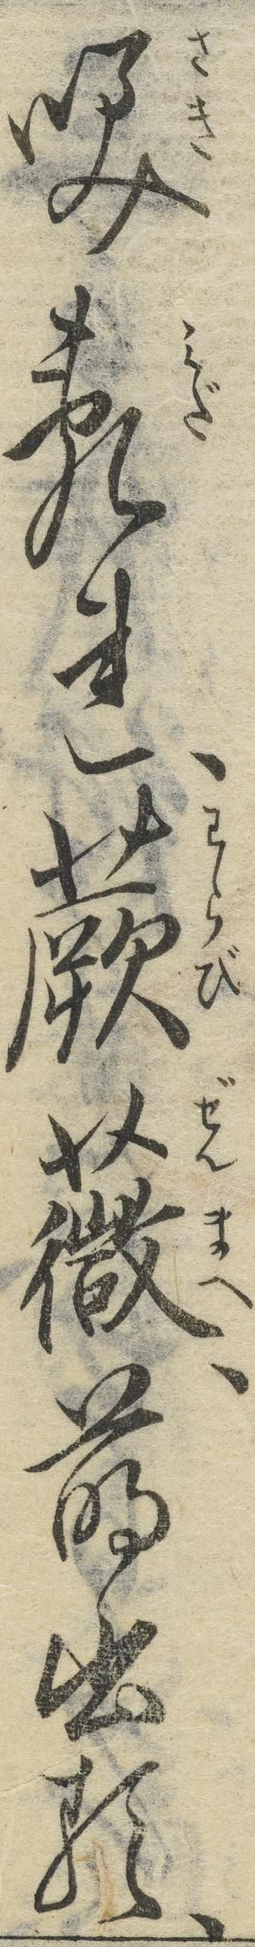咲乱れ、蕨薇、萌出る、
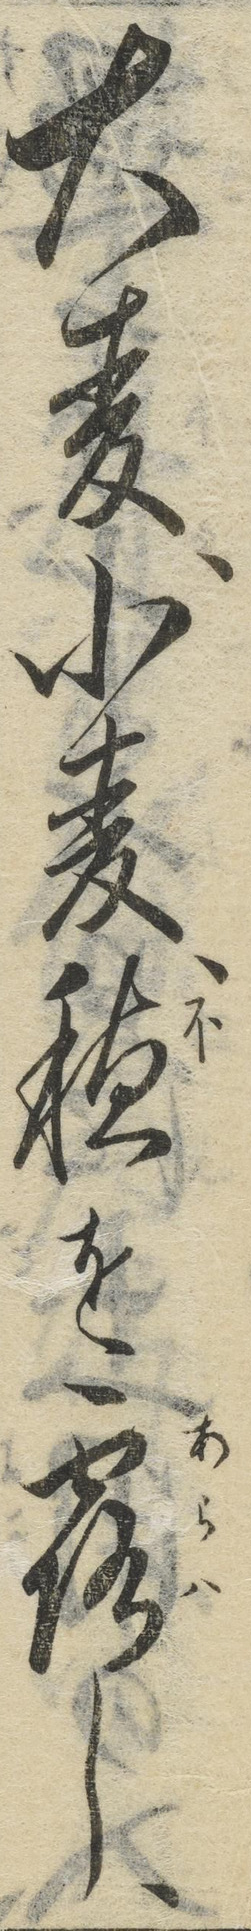大麦、小麦、穂を露し、
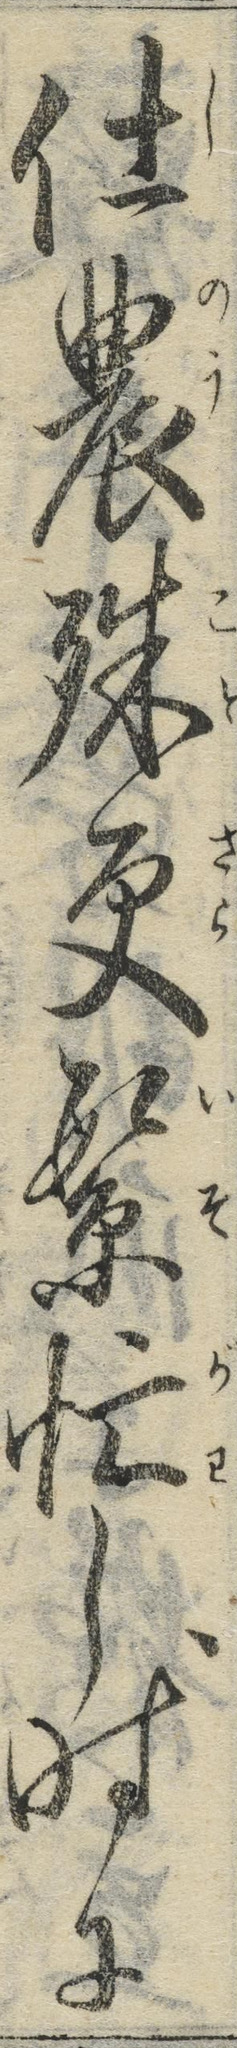仕農殊更繁忙し、時に
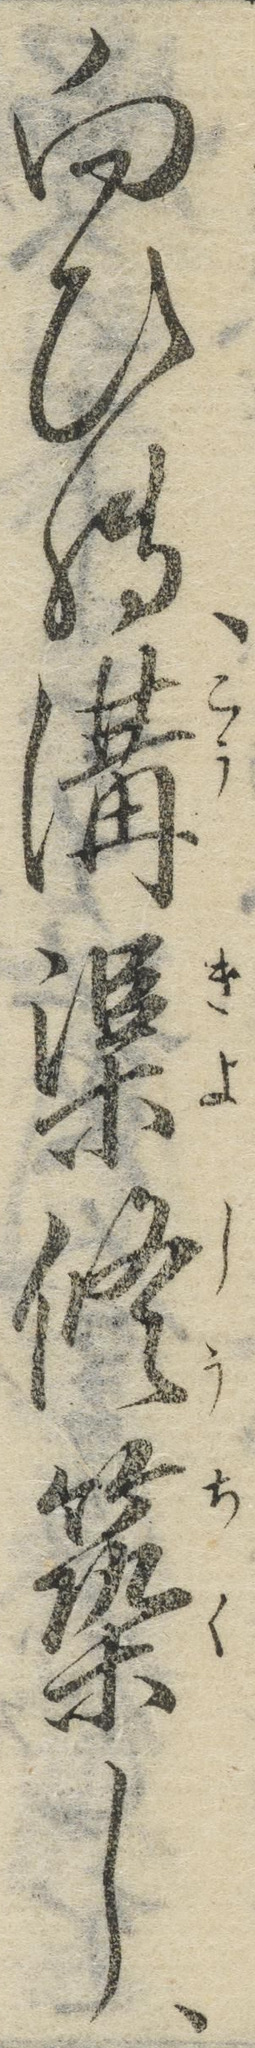向ひて、溝渠修築し、
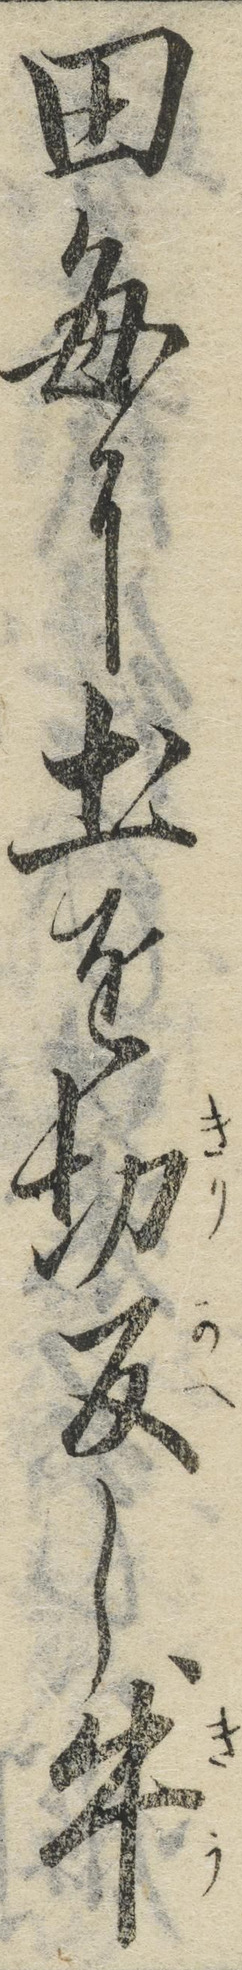田毎に土を切反し、牛
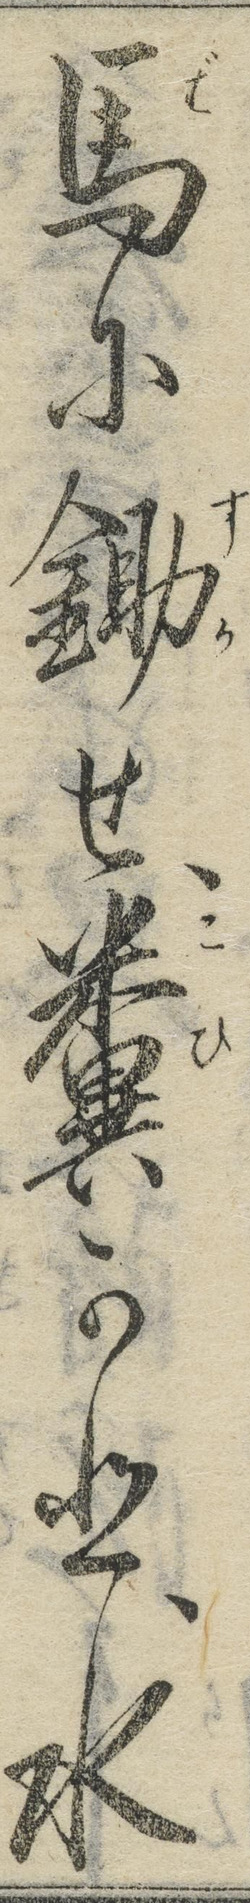馬に鋤せ、糞かひ、水
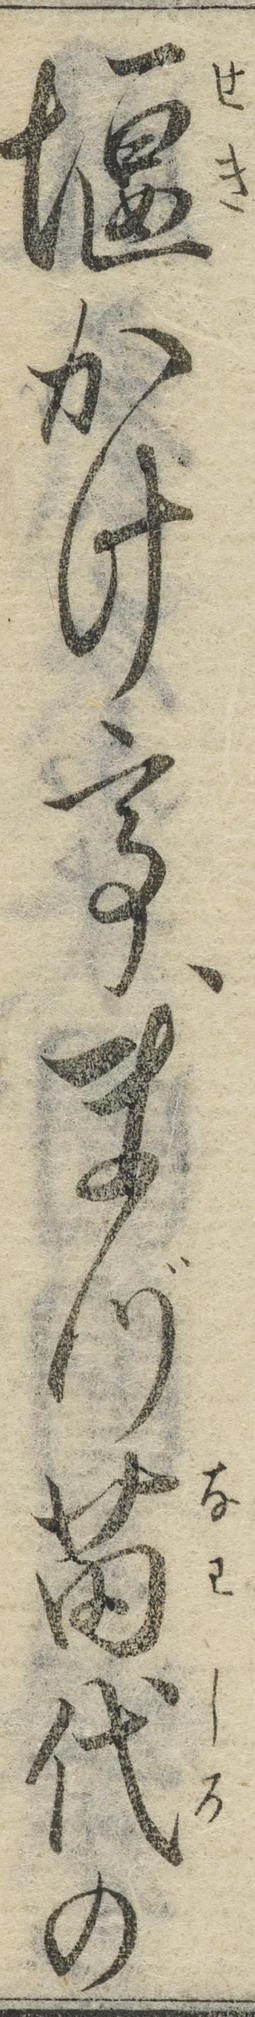堰かけて、まづ苗代の

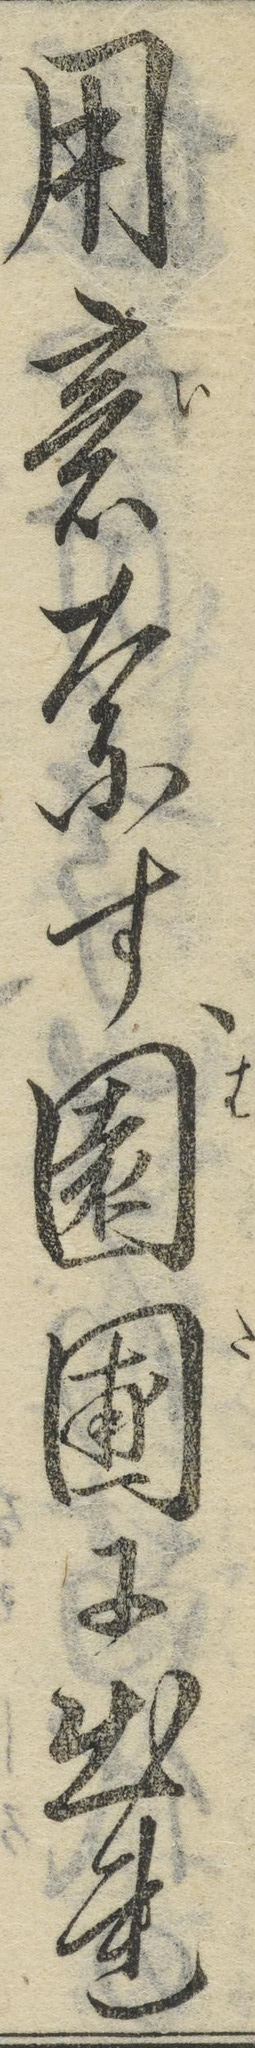用意なす、園圃に出れ
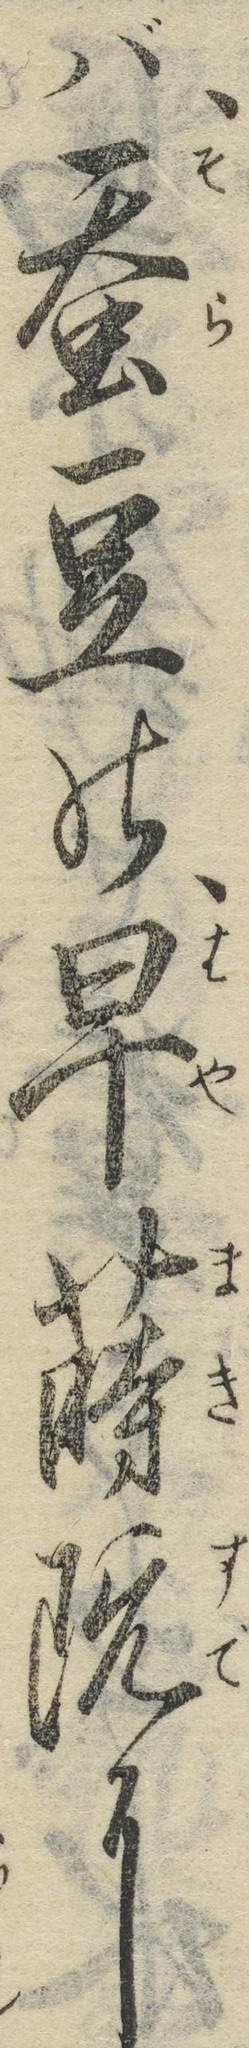ば、蚕豆の早蒔既に
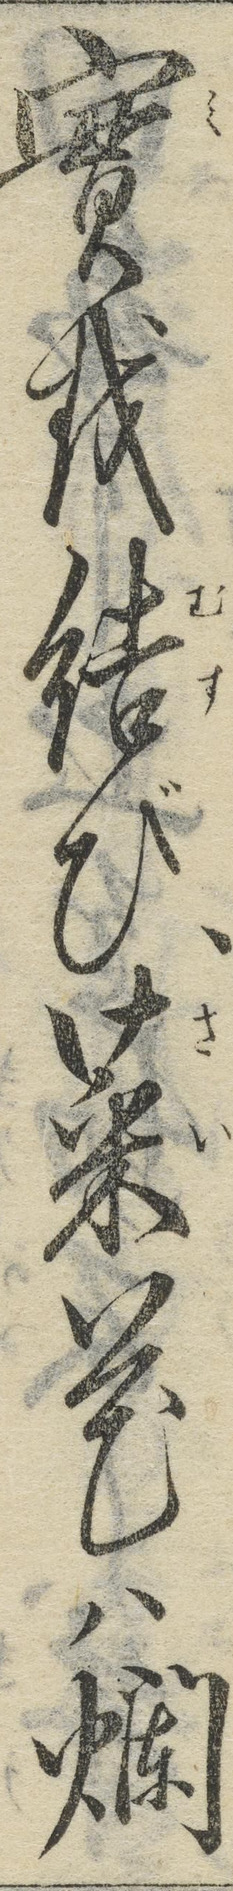実を結び、菜花は爛
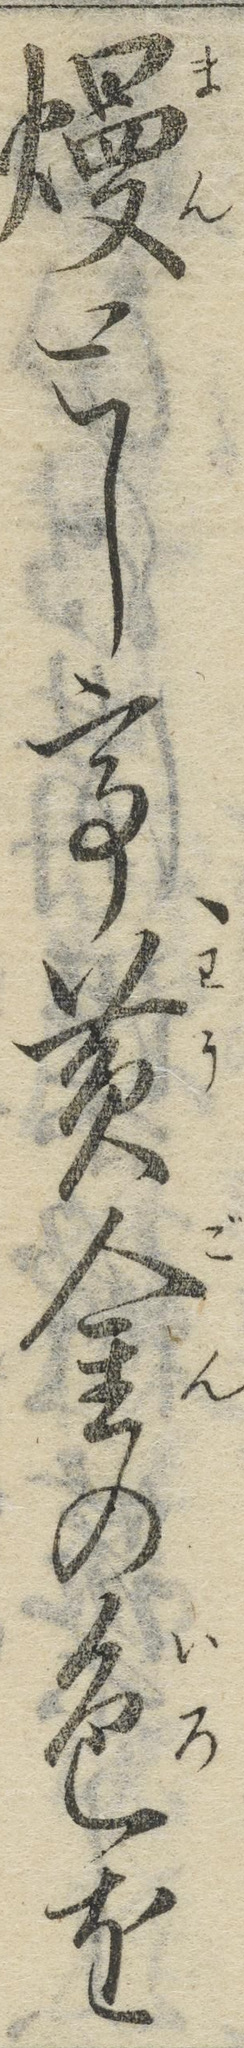漫として、黄金の色を
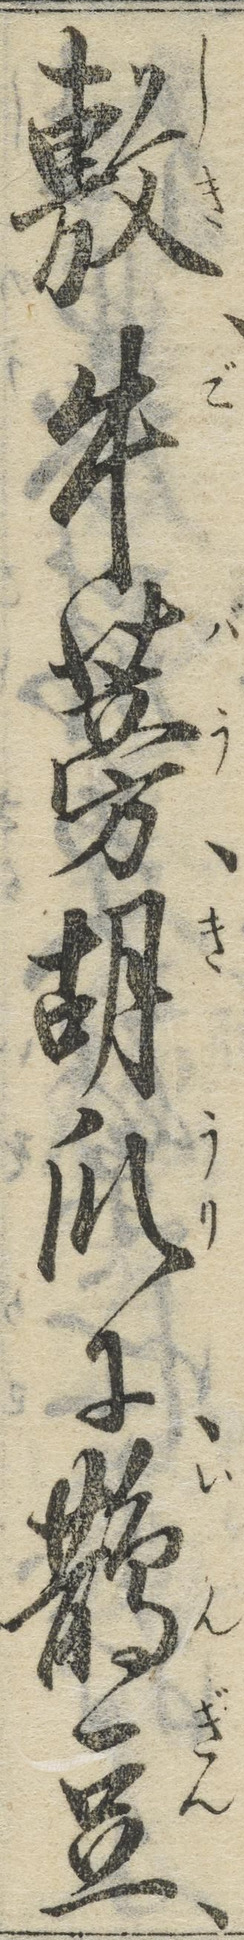敷、牛蒡、胡瓜に、鵲豆、
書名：暦日往来　單
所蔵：東京大学地震研究所図書室 Earthquake Research Institute Library, The University of Tokyo, JAPAN
